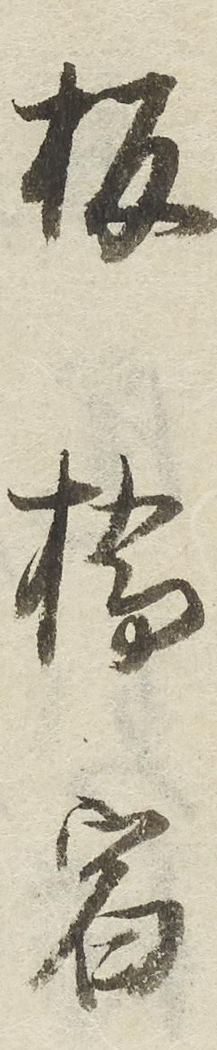板橋村
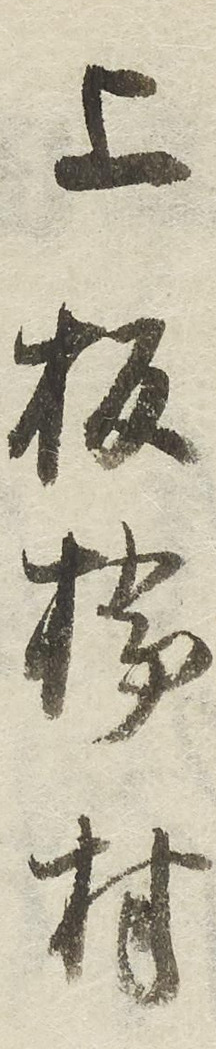上板橋村
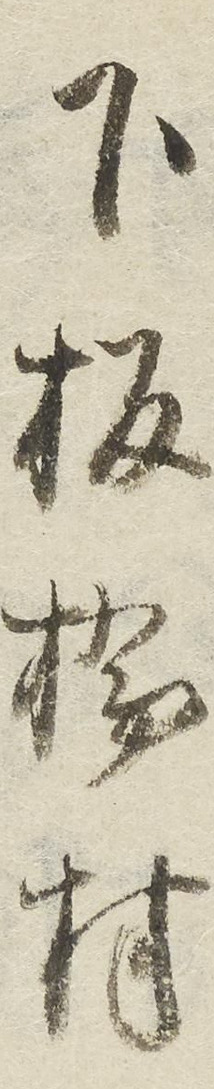下板橋村
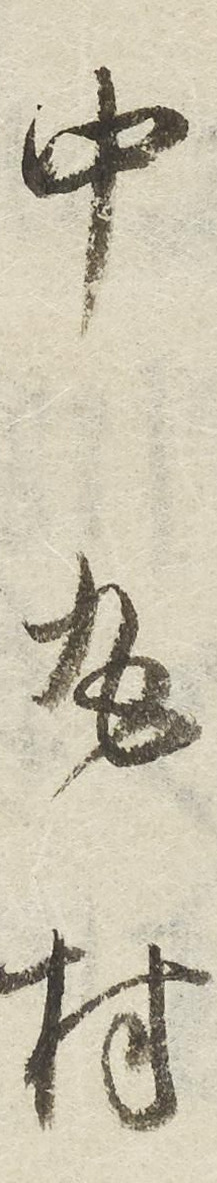中丸村
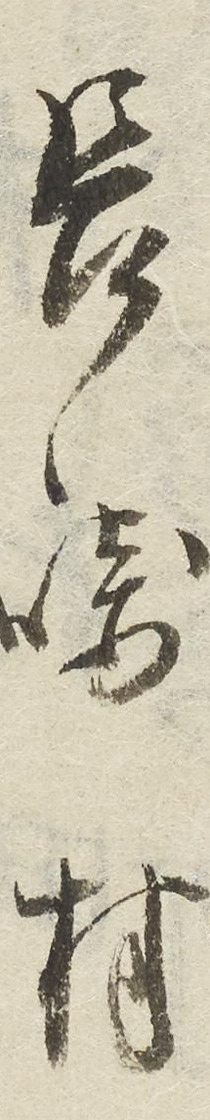長崎村
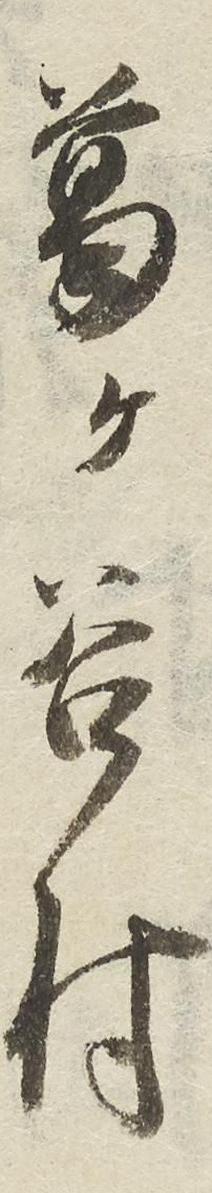葛ヶ谷村
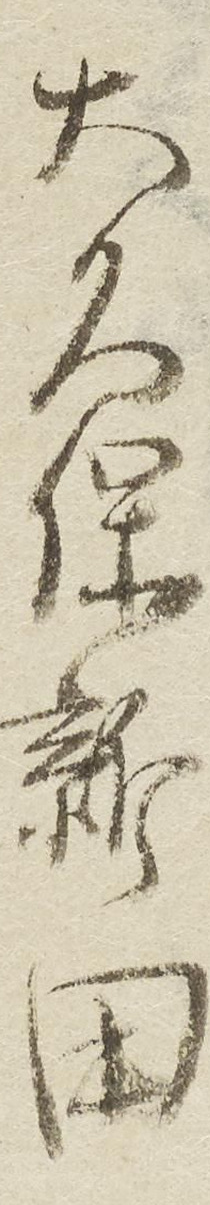大久保新田
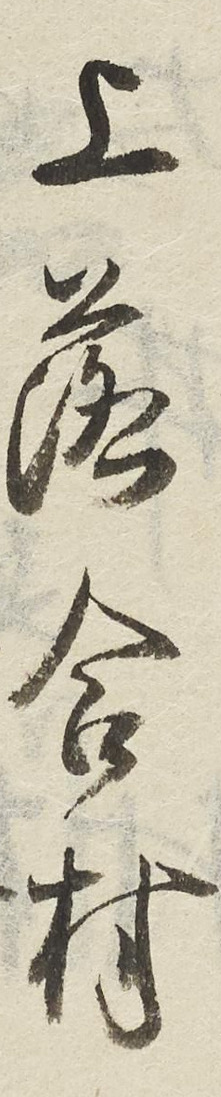上落合村
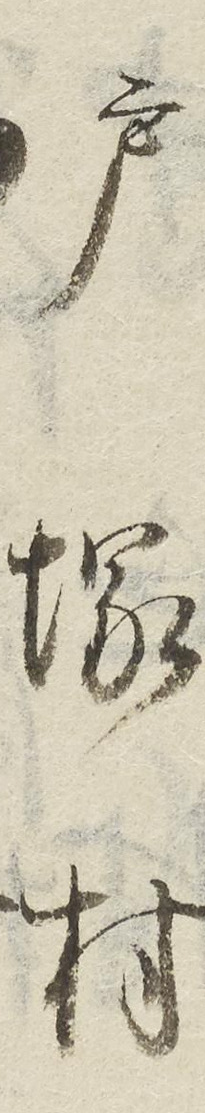戸塚村
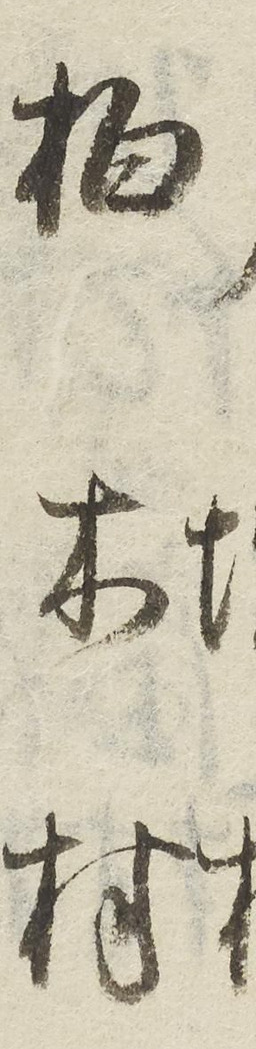柏木村
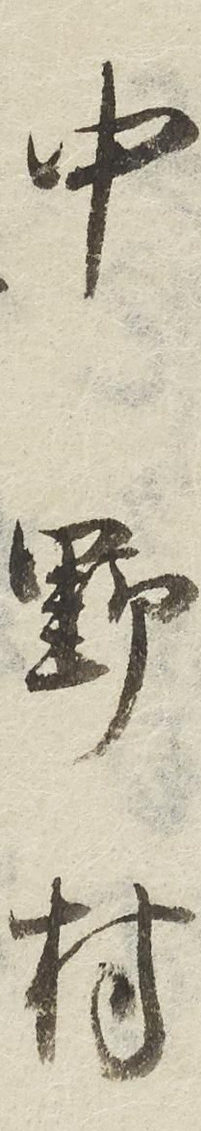中野村
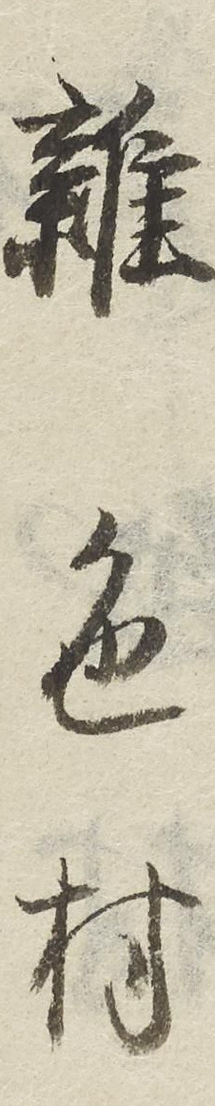雑色村
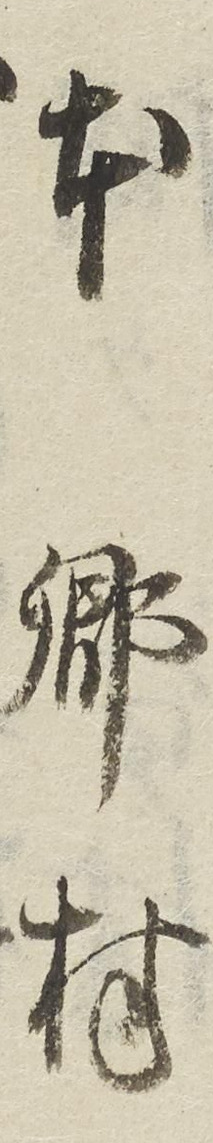本郷村
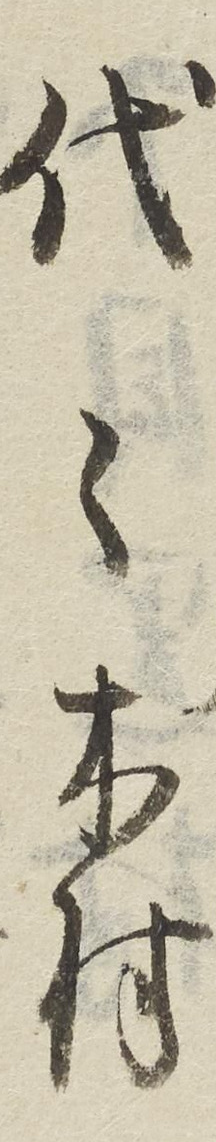代々木村
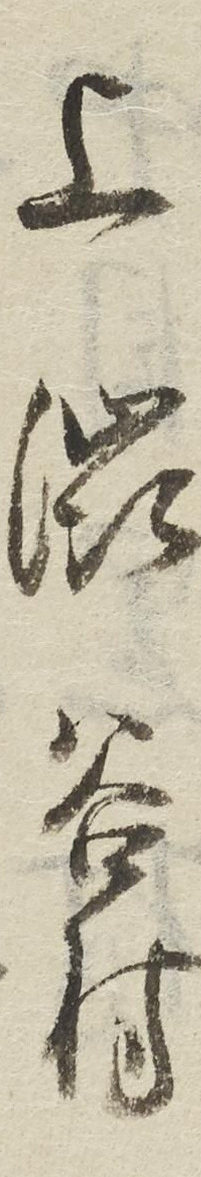上渋谷村
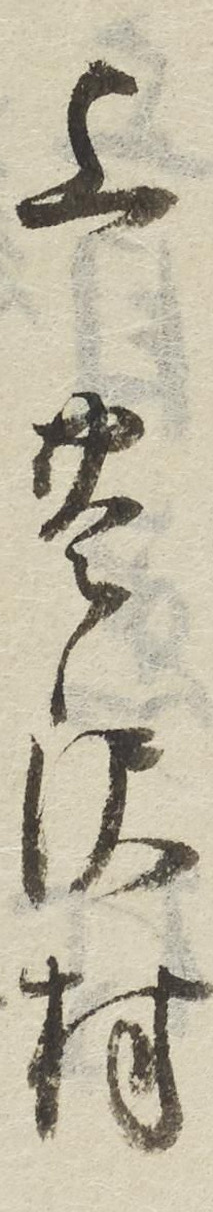上豊沢村
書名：[梵鐘差出一件]
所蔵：東京大学地震研究所図書室 Earthquake Research Institute Library, The University of Tokyo, JAPAN
